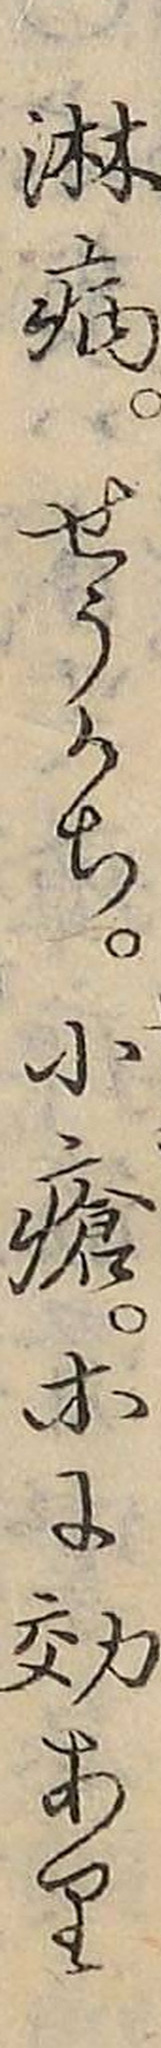淋病。せうかち。小瘡等に効あり
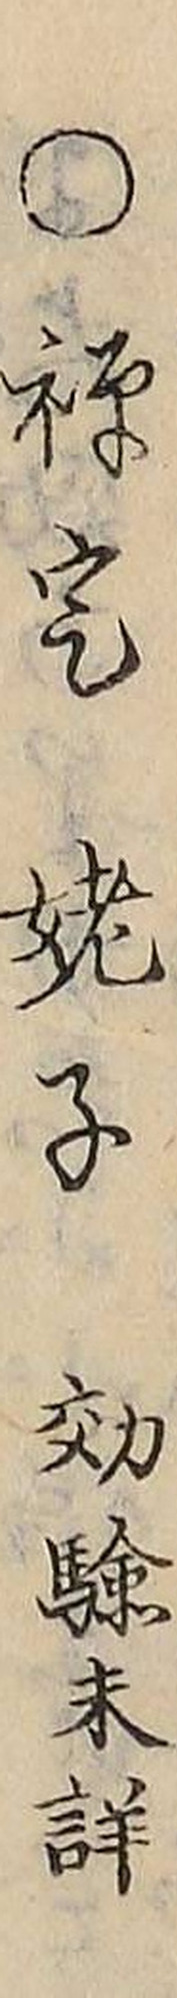○禅定姥子効験未詳
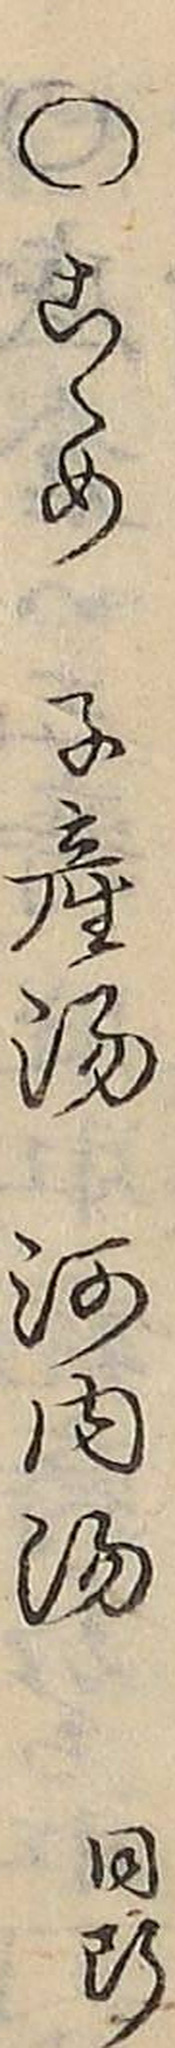○こゝめ子産湯河内湯同断
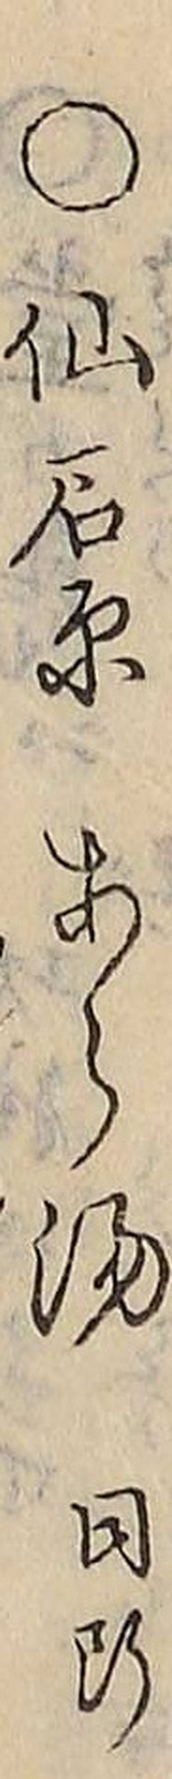○仙石原あら湯同断
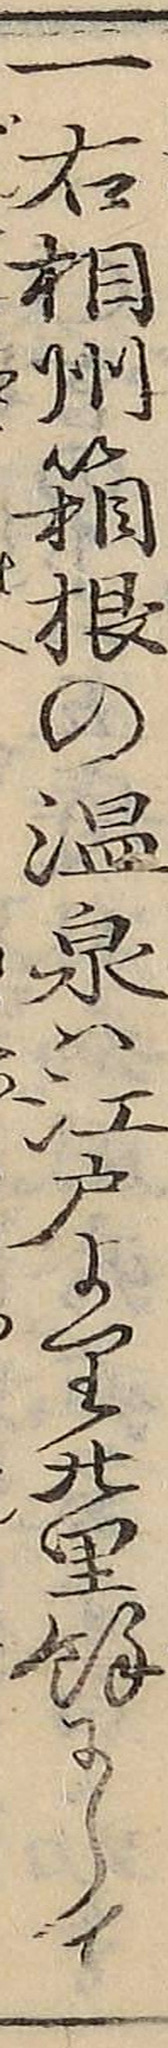一右相州箱根の温泉は江戸より廿里余にして
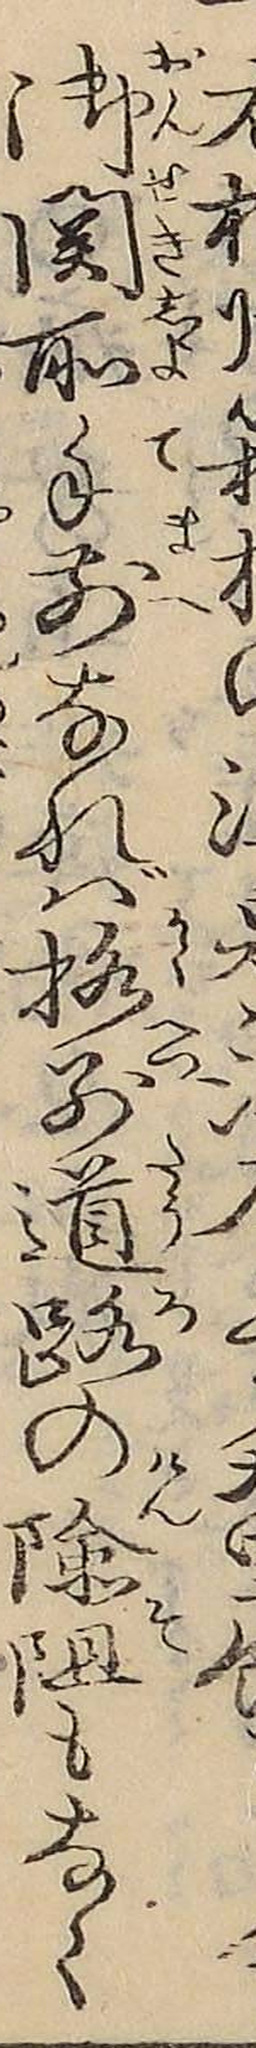御関所手前なれば格別道路の険阻もなく
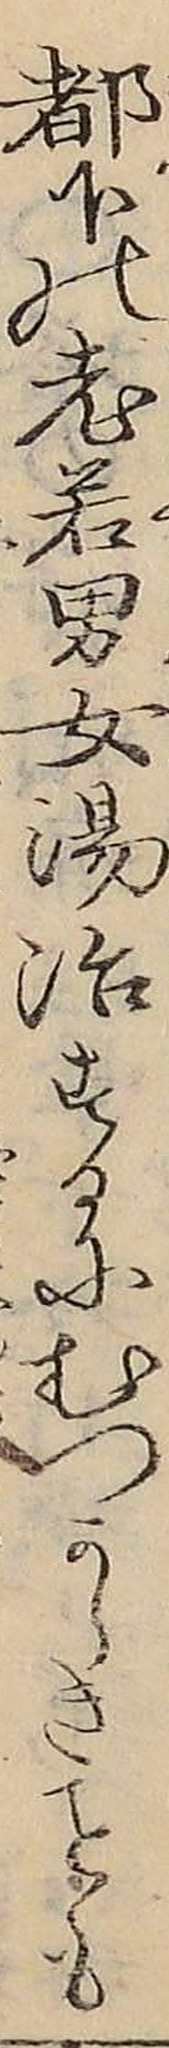都下の老若男女湯治するにむつかしきことも
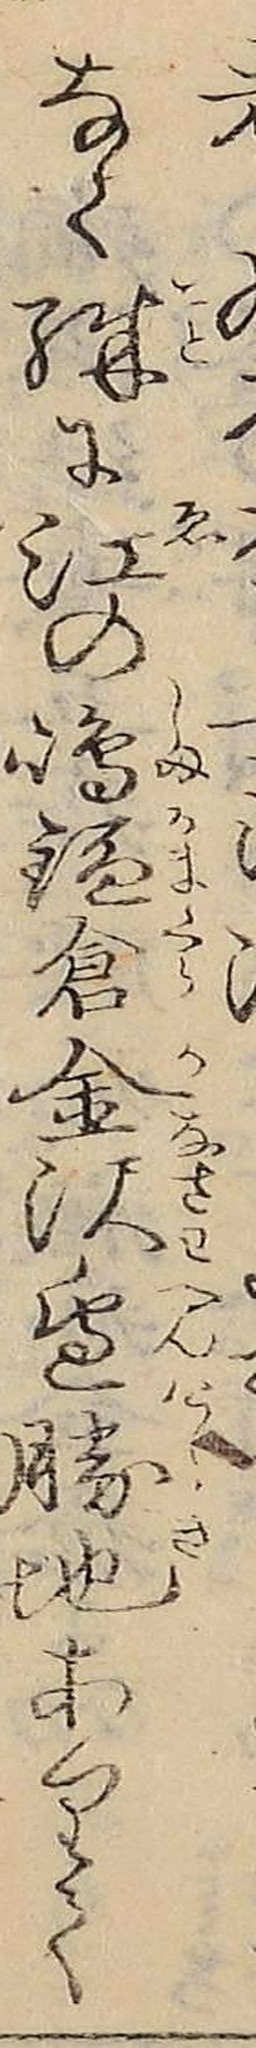なく殊に江の島鎌倉金沢辺勝地ありて
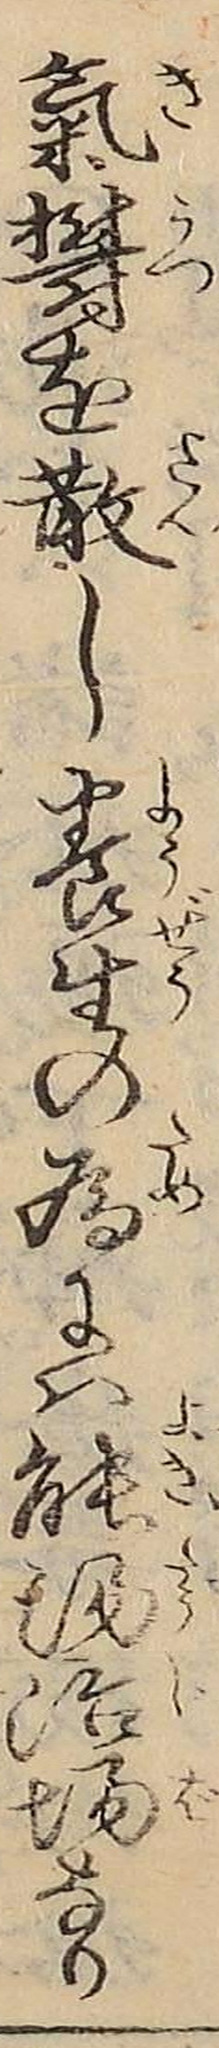気欝を散し養生の為には能湯治場なり
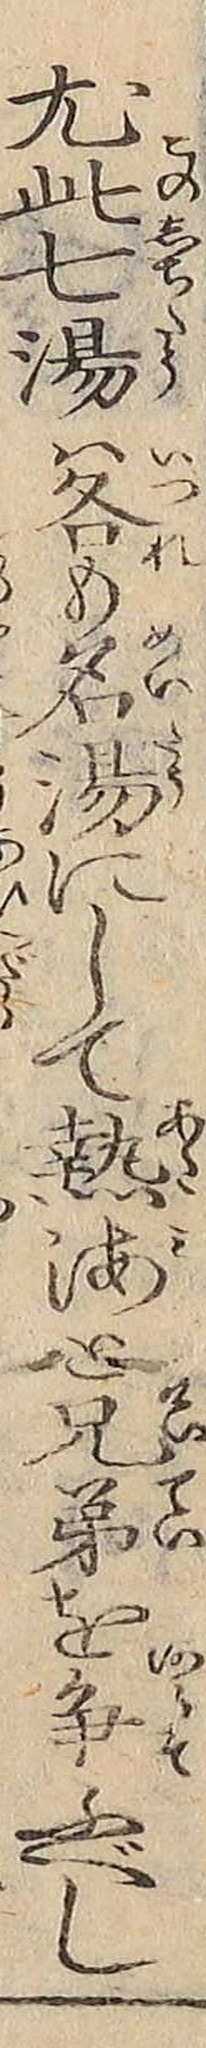尤此七湯は各も名湯にして熱海と兄弟を争ふべし
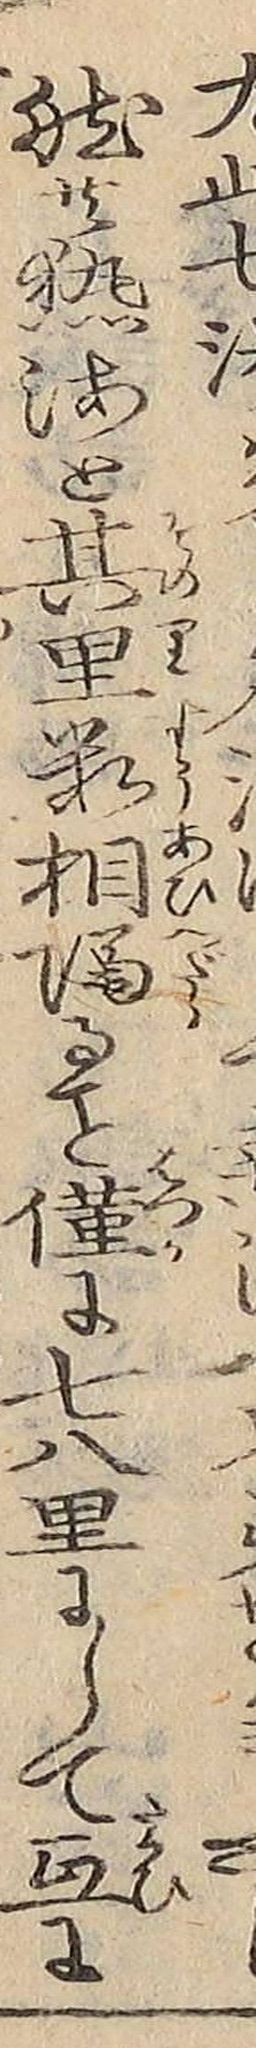然共熱海と其里数相隔ること僅に七八里にして互に
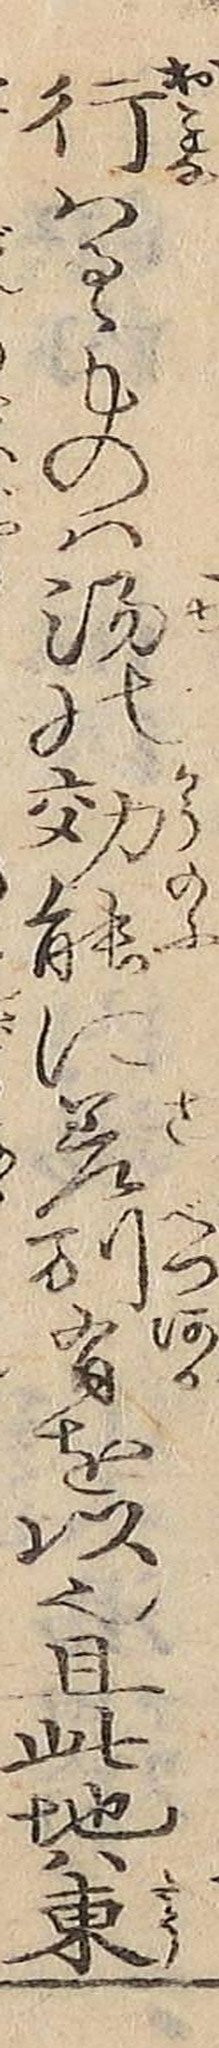行はるゝものは湯の効能に差別有を以也且此地は東
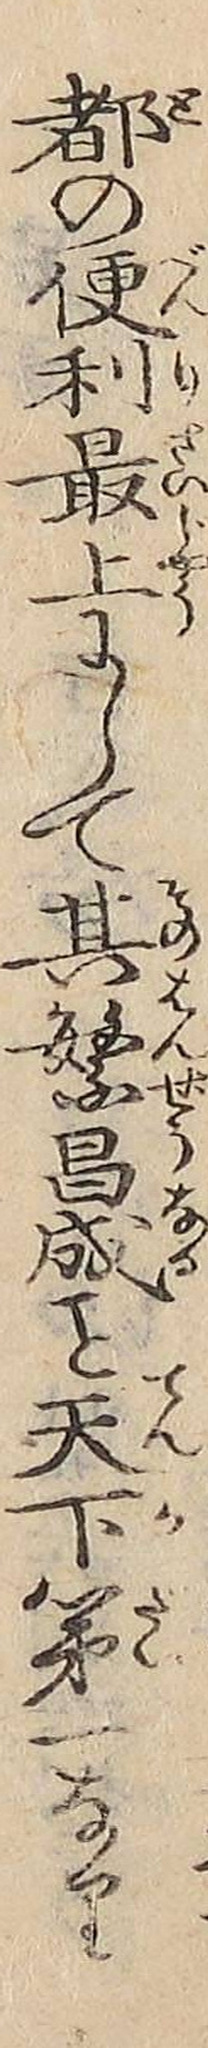都の便利最上にして其繁昌成こと天下第一なり
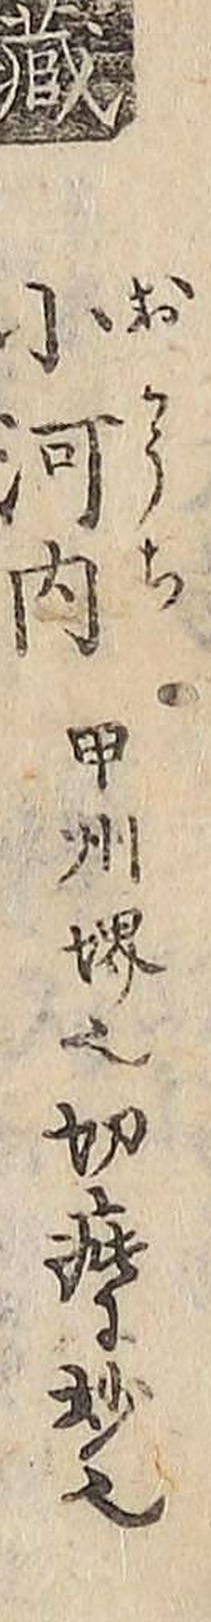武蔵小河内甲州堺也切痔に妙也
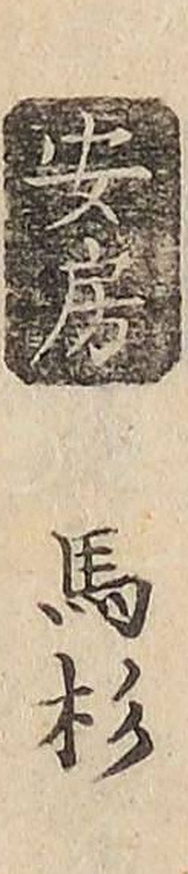安房馬杉

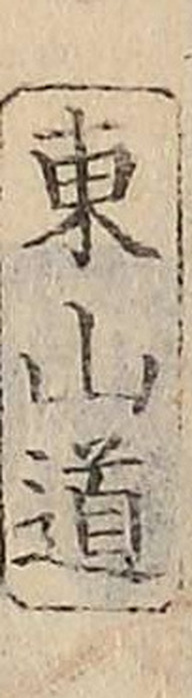東山道
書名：旅行用心集
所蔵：神戸大学附属図書館 国文学研究資料館
